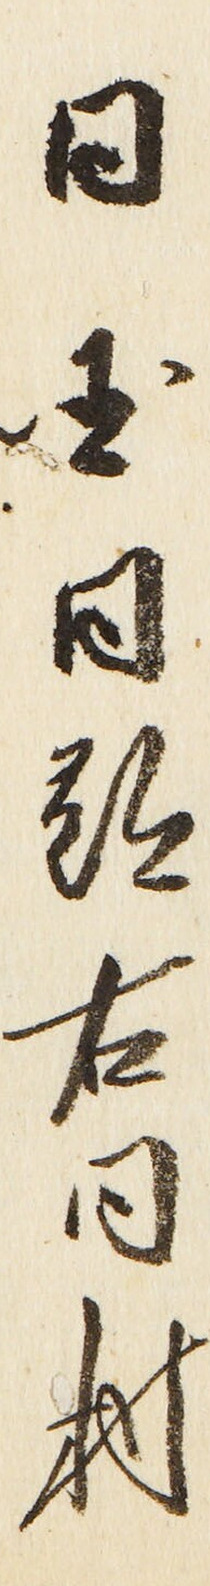同国同郡右同村

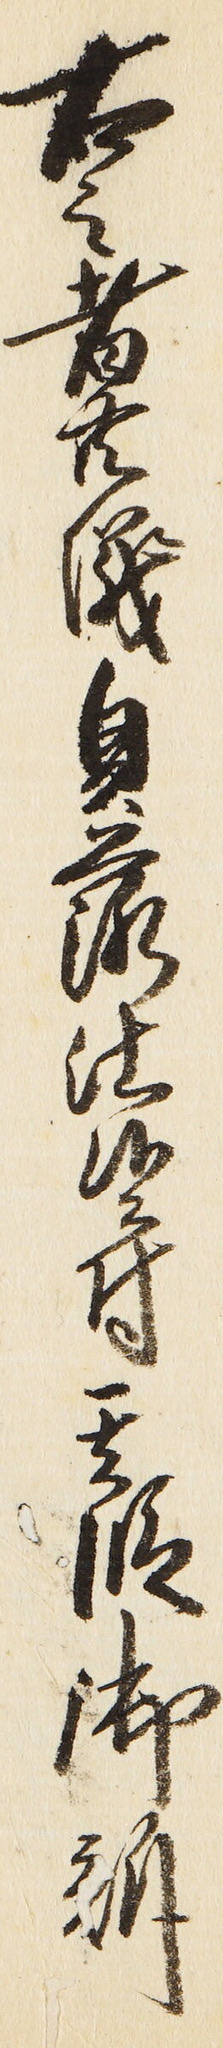右之者共儀貝落仕候ニ付其段御訴
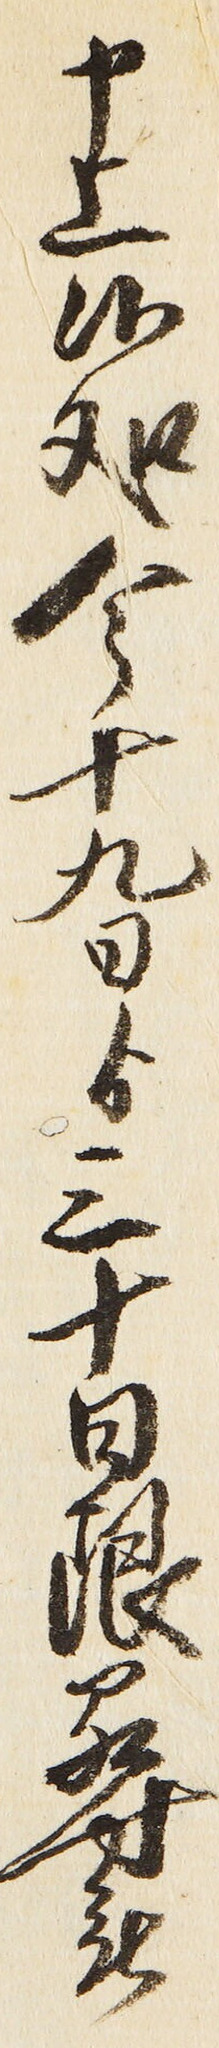申上候処今十九日ゟ三十日限尋被
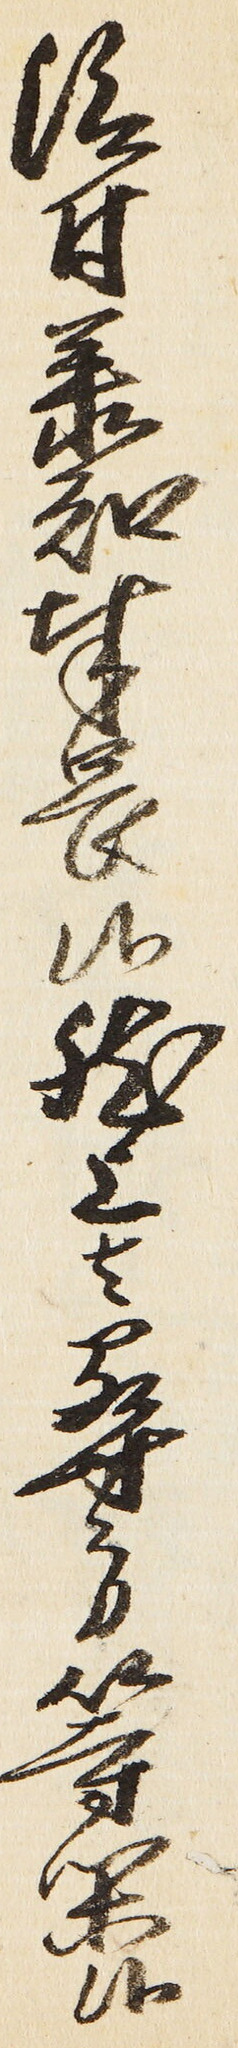仰付承知奉畏候然上者尋方等閑候
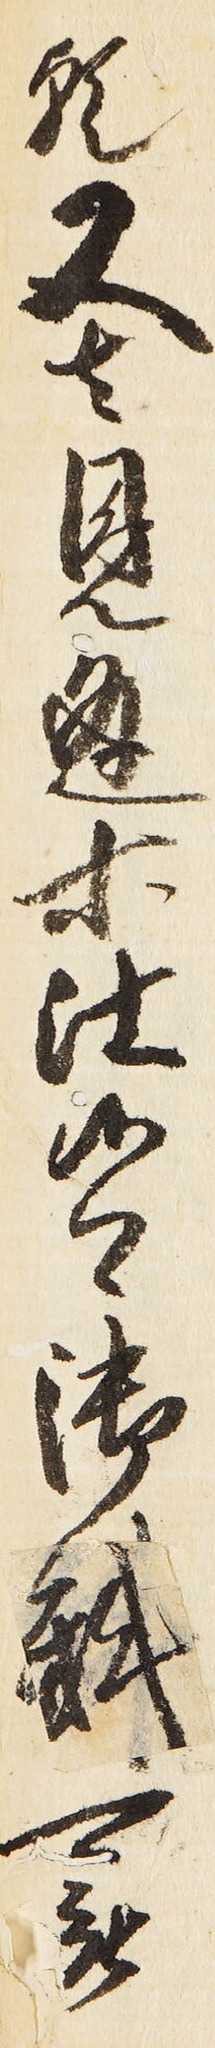歟又者見逃等仕候ハヽ御料可被
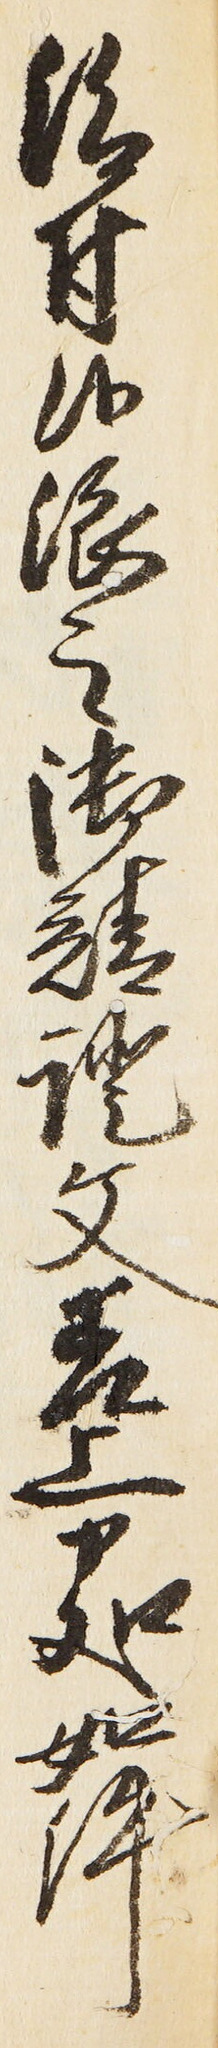仰付候依之御請証文差上申処如件
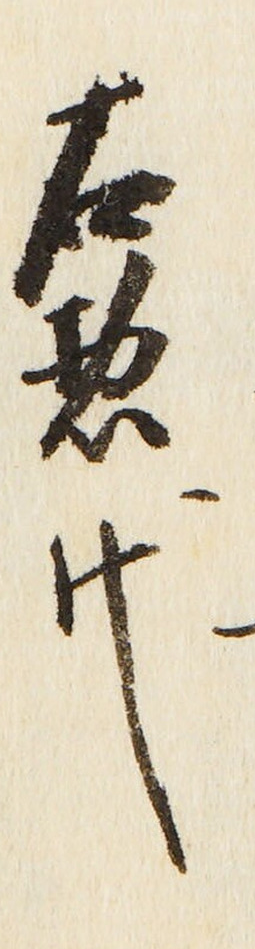右惣代

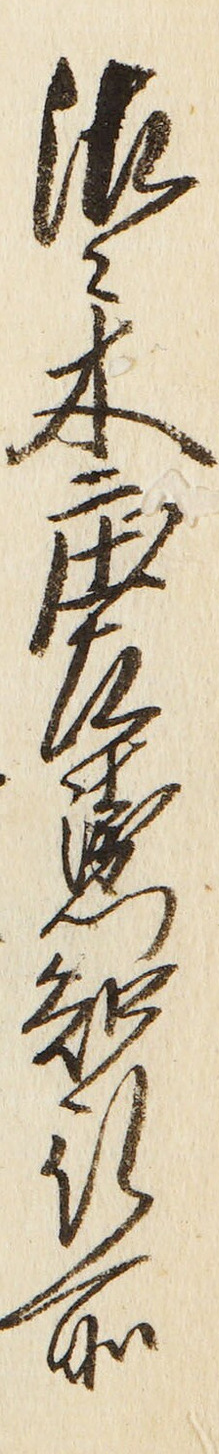佐々木庄左衛門知行所
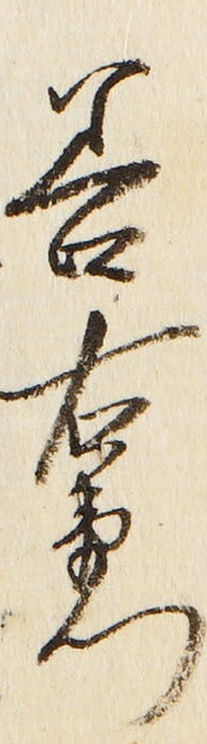善右衛門
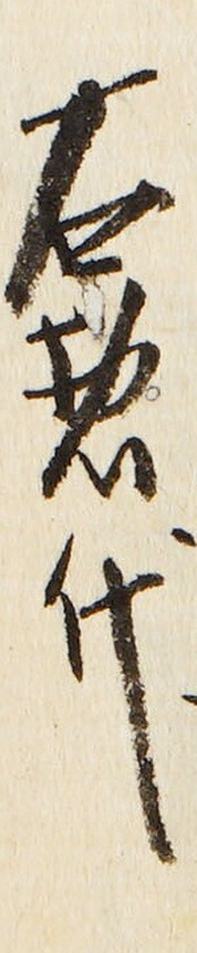右惣代
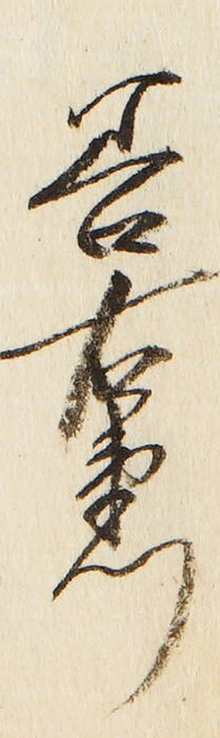善右衛門
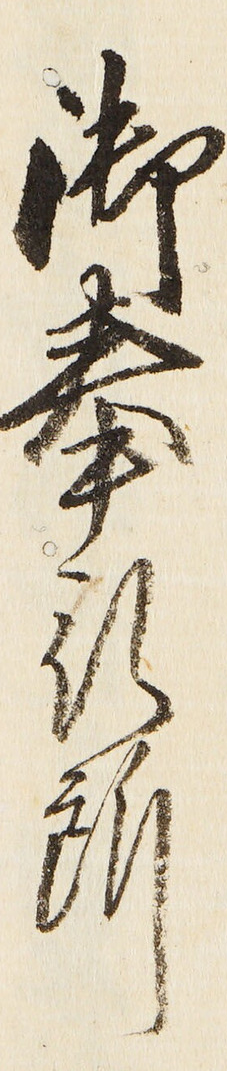御奉行所
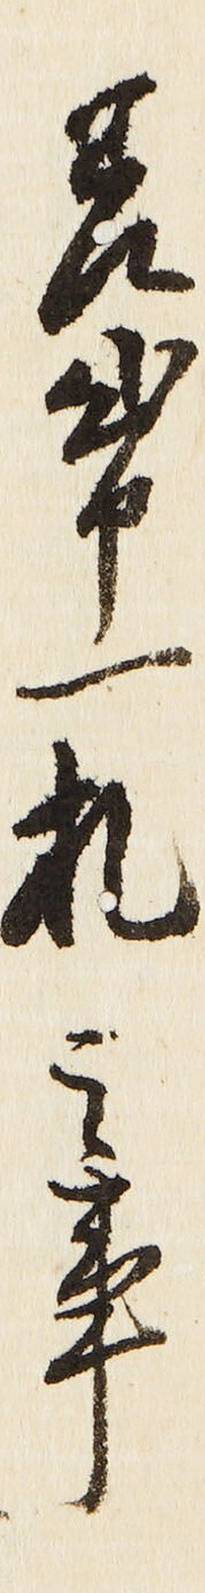差出申一札之事
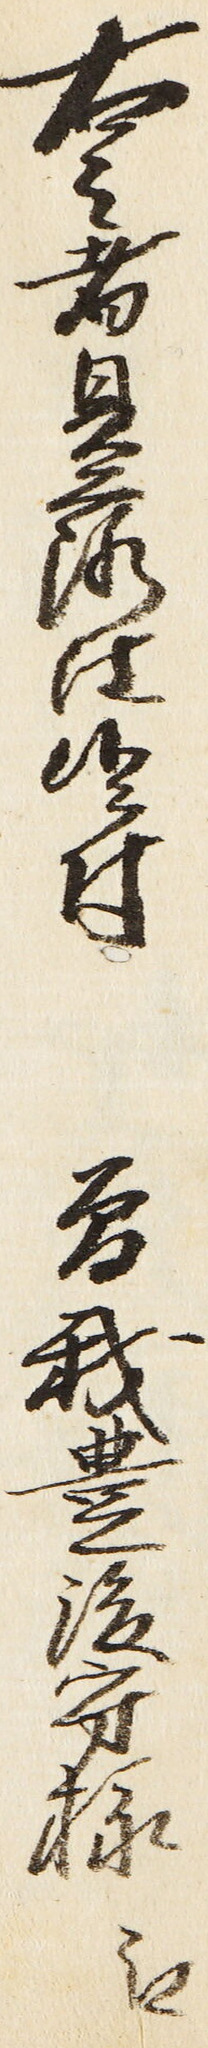右之者貝落仕候ニ付曽我豊後守様江
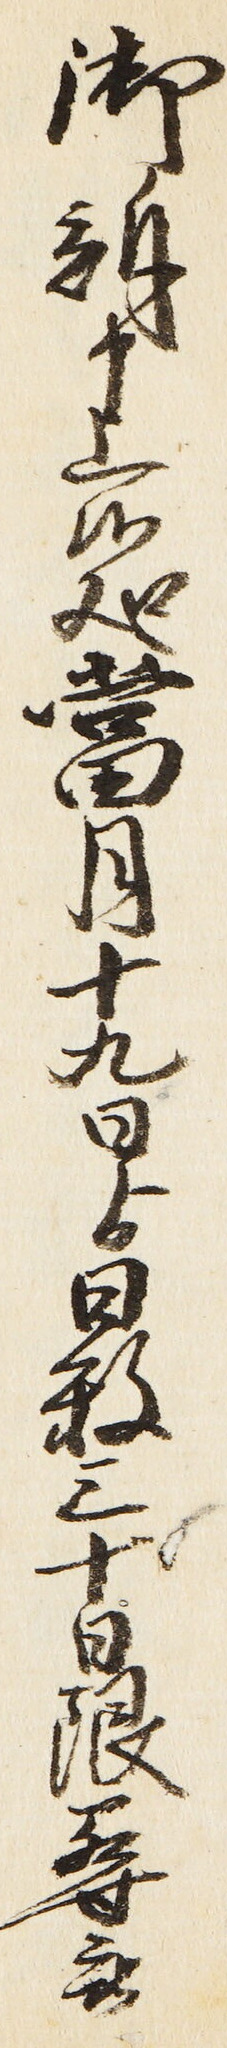御訴申上候処当月十九日ゟ日数三十日限尋被
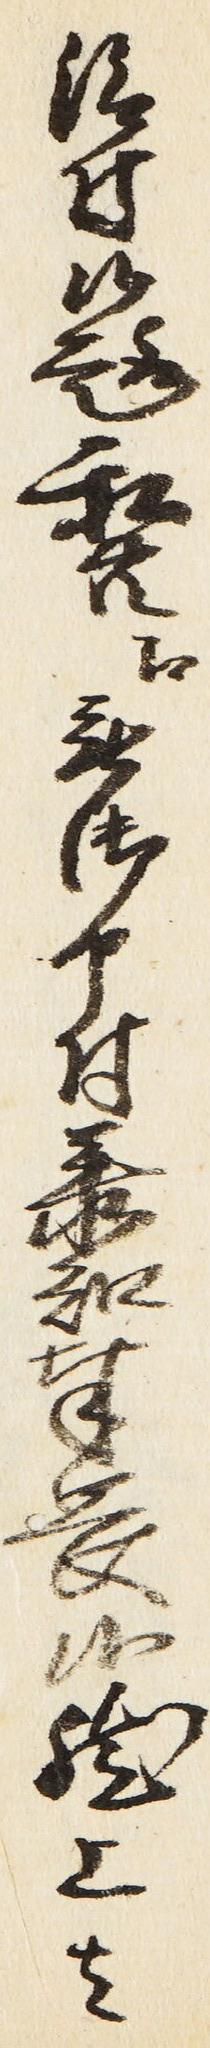仰付候趣私共江被御申付承知奉畏候然上者
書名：難船一件記録
